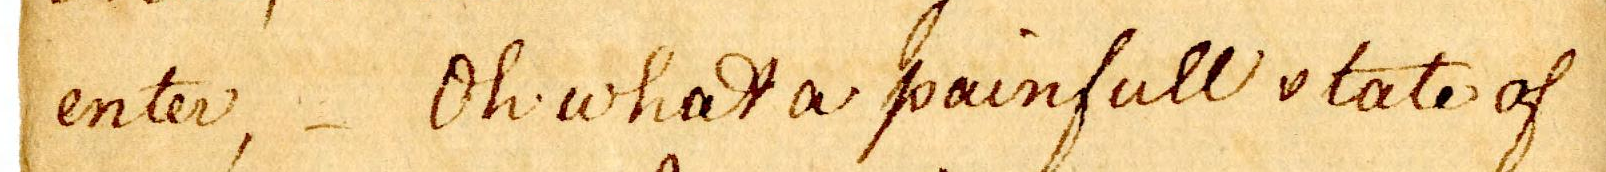enter,- Oh what a painfull state of
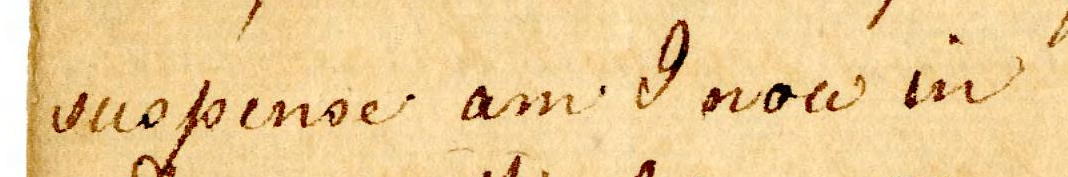suspense am I now in
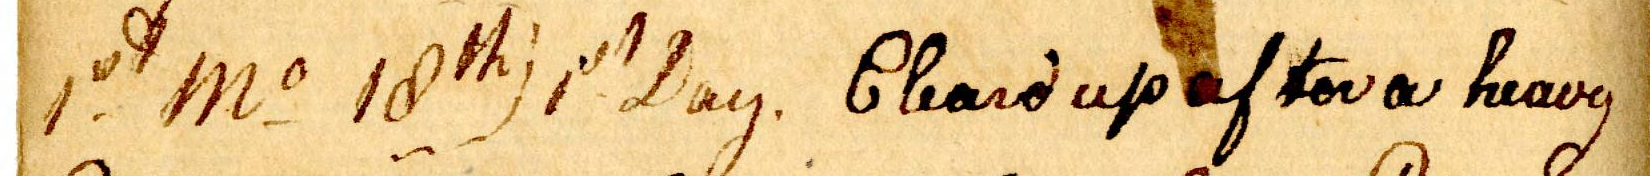1^st M^o 10^th) 1^st Day. Cleard up after a heavy
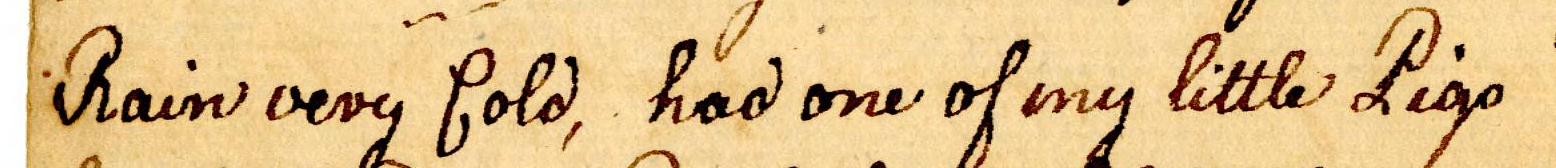Rain very Cold, had one of my little Pigs
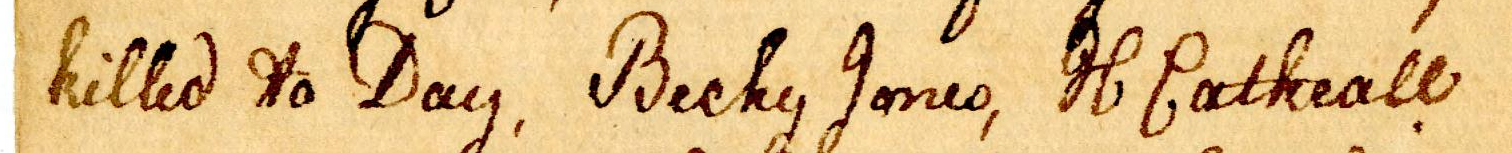killed to Day, Becky Jones, H Cathrall
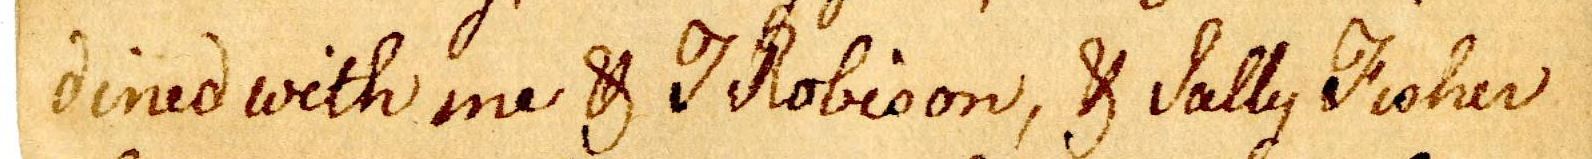dined with me & T Robison, & Sally Fisher
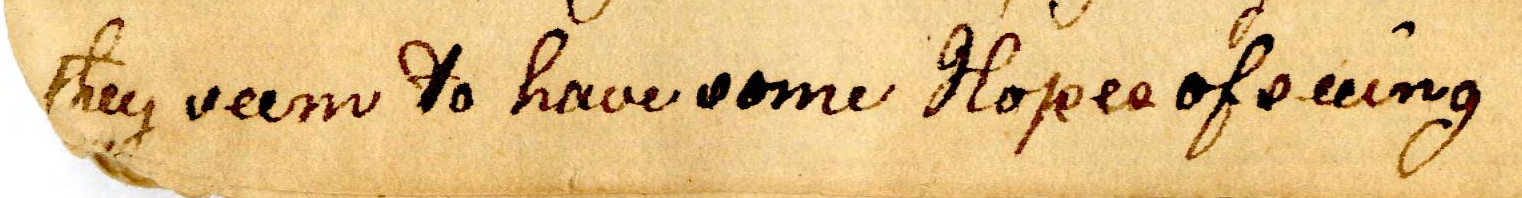they seem to have some Hopes of seeing
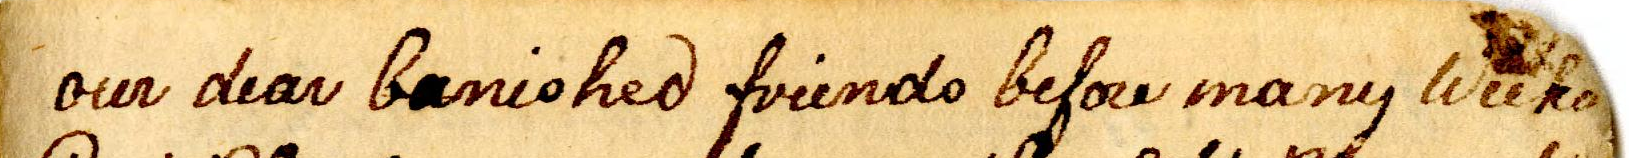our dear banished friends before many Weeks
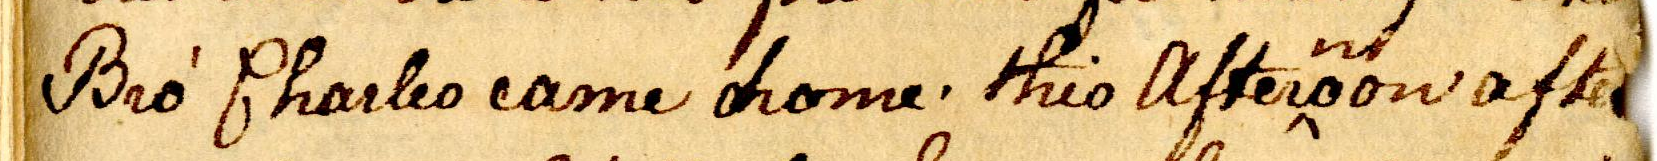Bro' Charles came home, this After ^n oon after
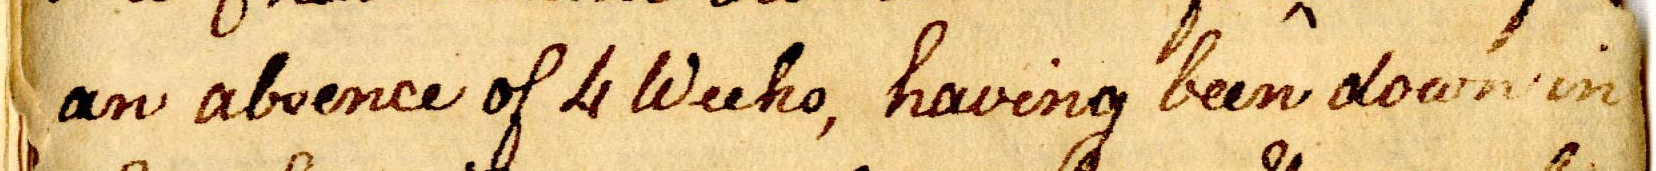an absence of 4 Weeks, having been down in
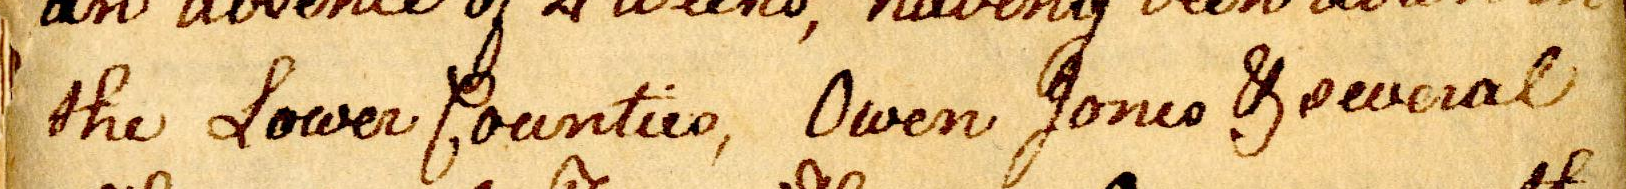the Lower Counties. Owen Jones & several
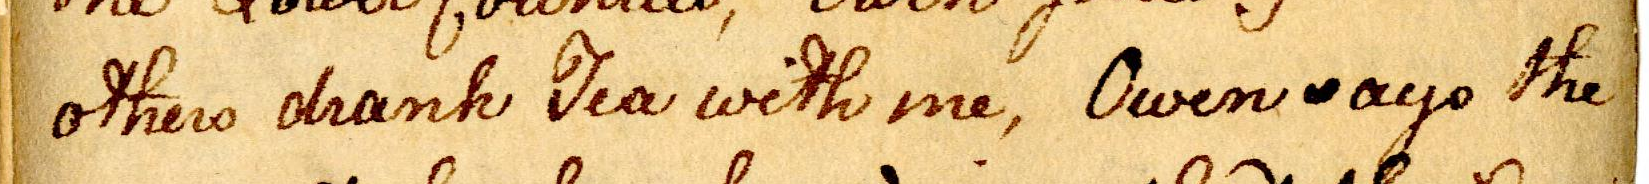others drank Tea with me, Owen says the
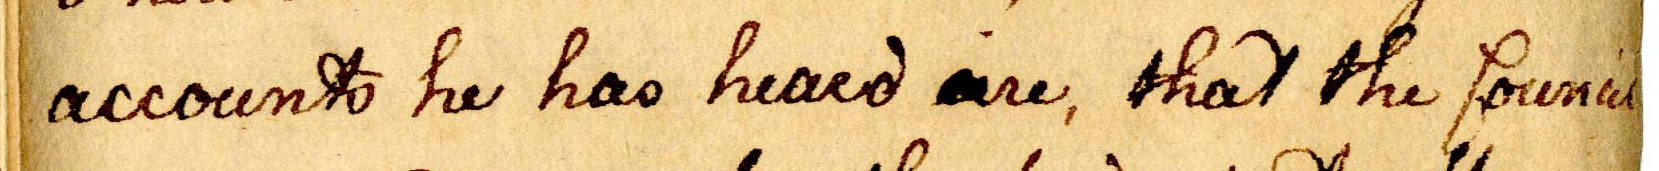accounts he has heard are, that the Counccil
